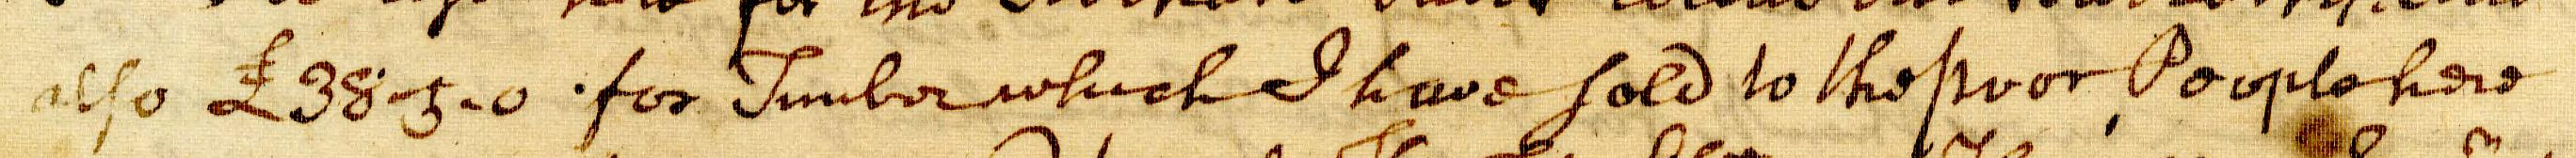also ₤38 50 for Timber which I have sold to the poor People here
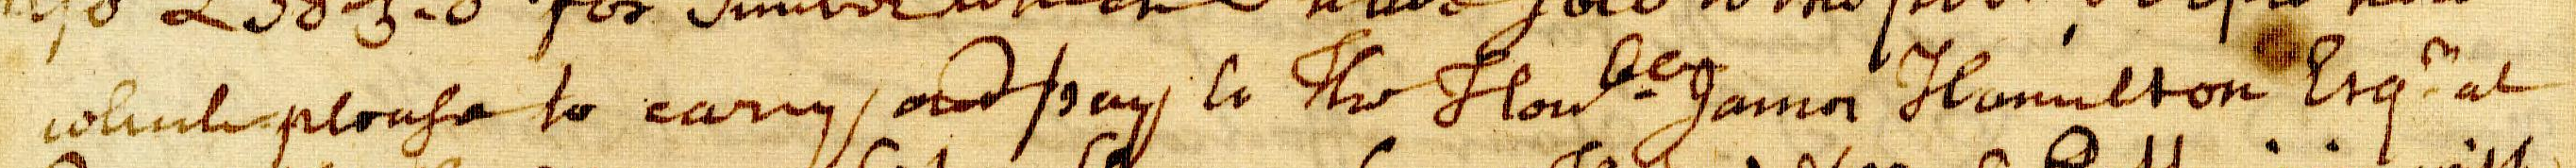which please to carry and pay to the Hon^ble. James Hamilton Esq^r. at
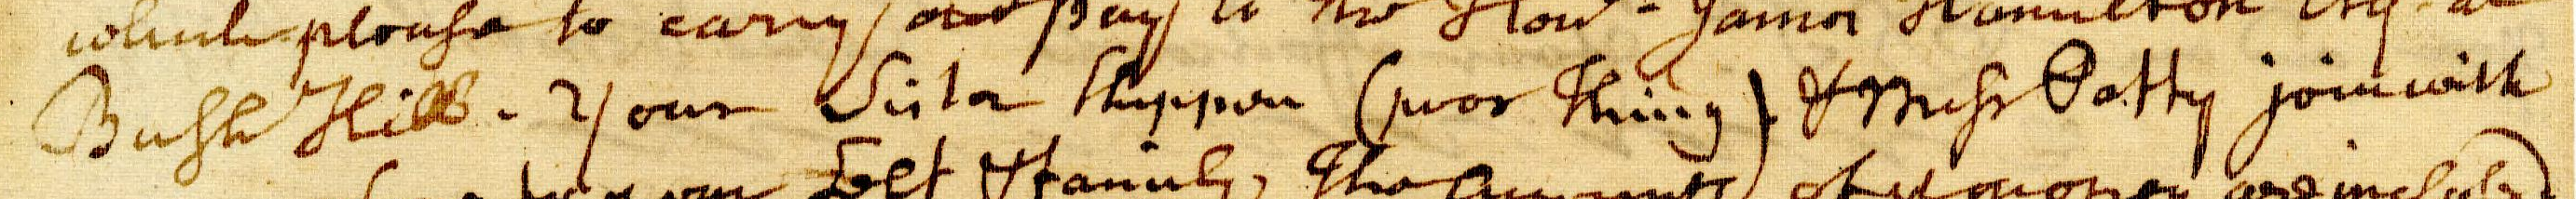Bush Hill. Your Sister Shippen (poor thing) & & Miss Patty join with
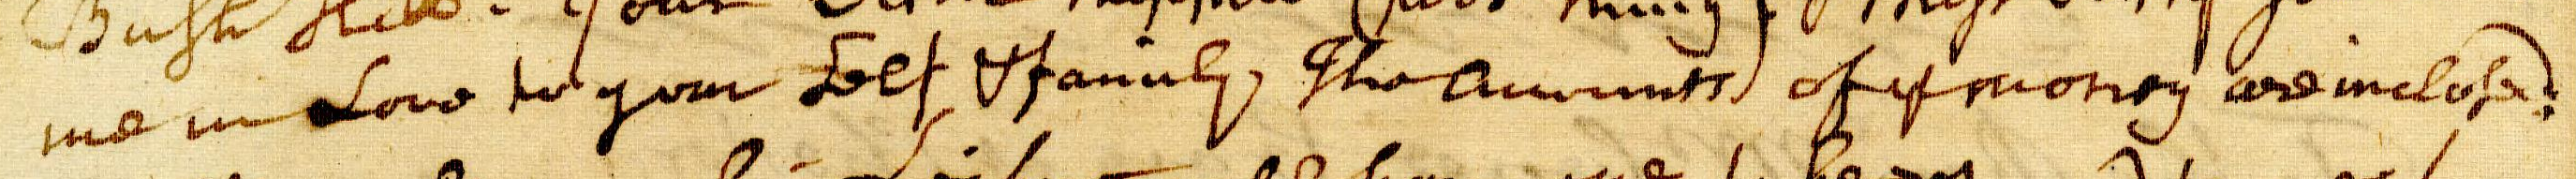me in Love to your Self & family The accounts of y^e money are inclose^d.
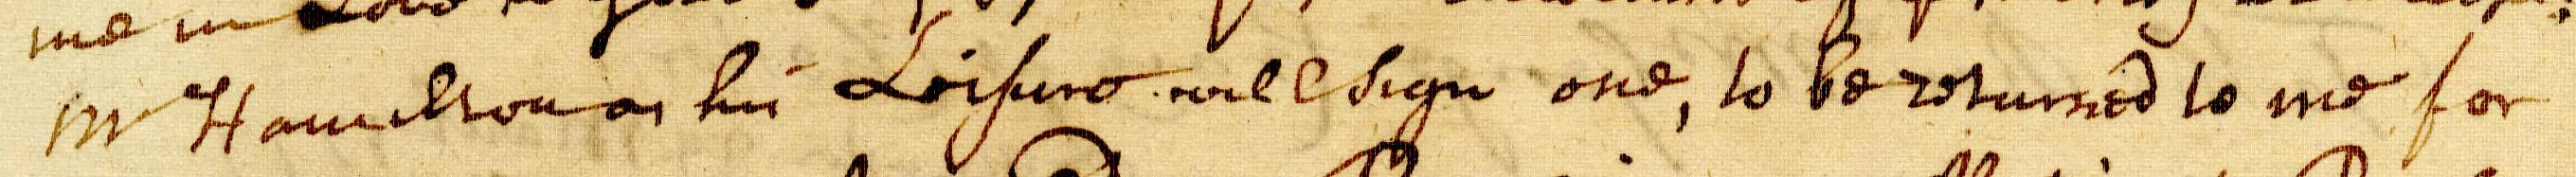M^r Hamilton as his Leisure will sign one, to be returned to me for
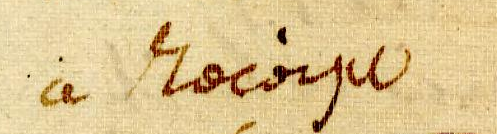a Receipt
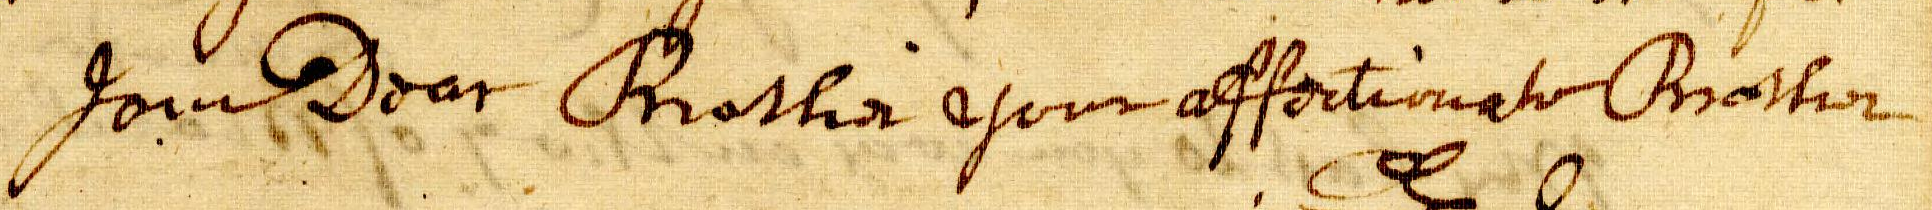I am Dear Brother Your affectionate Brother
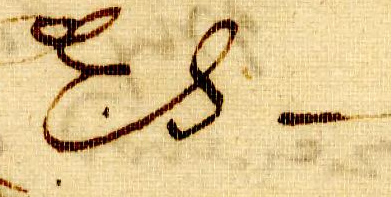E.S-
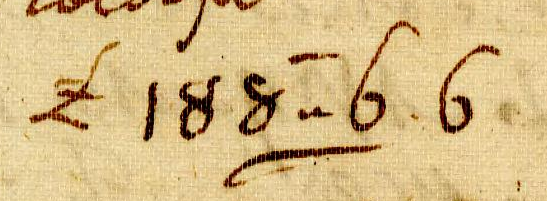£188..6.6
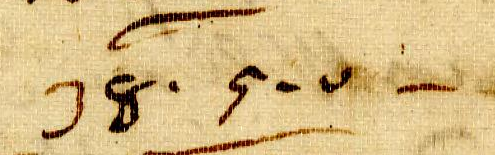38.5.0-
